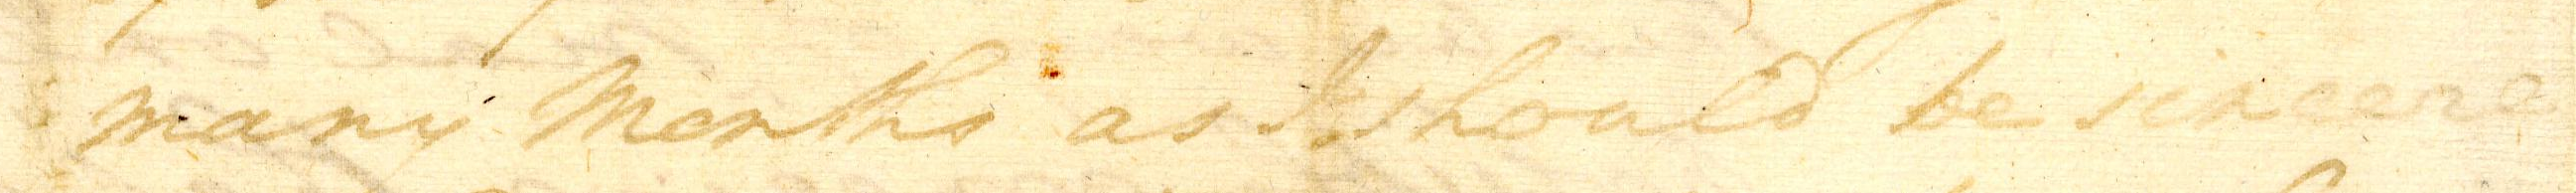many Months as I should be sincere
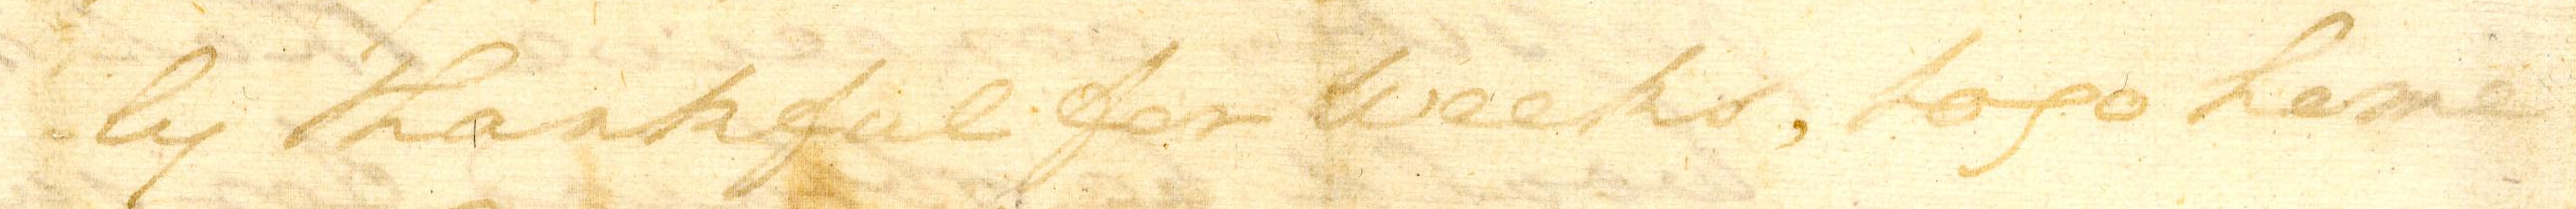ly thankful for weeks, to go home
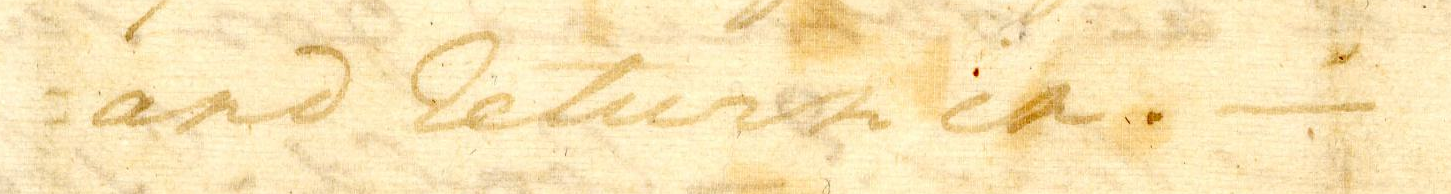and return in.-
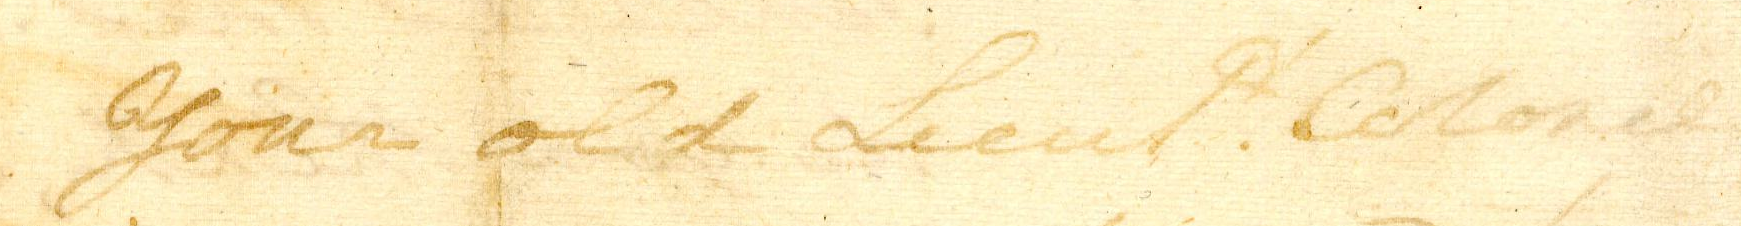Your old Lieut^t. Colonel
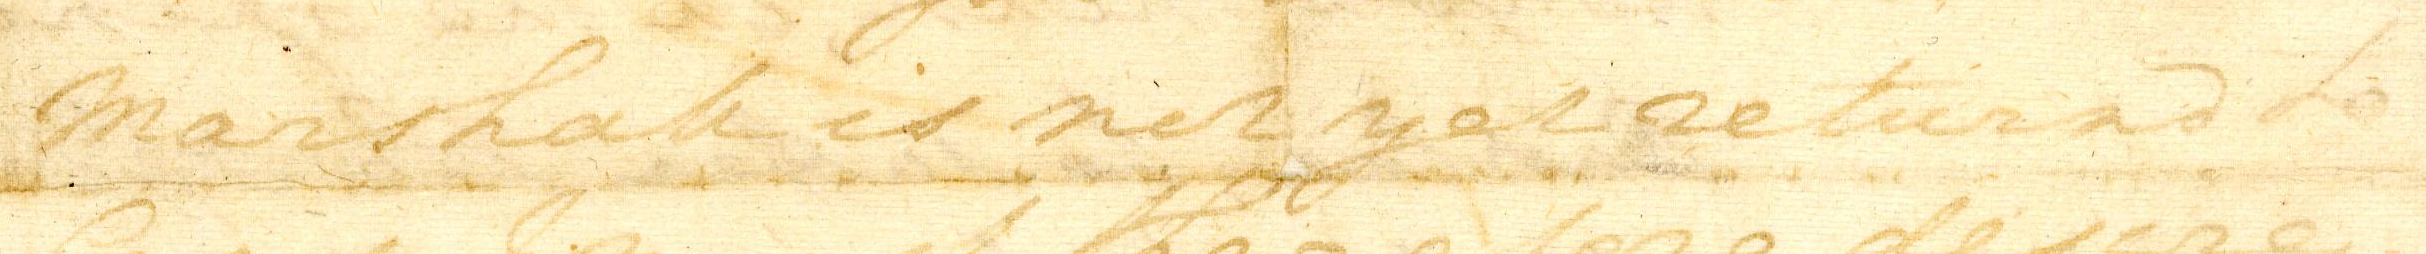Marshall is not yet returnd to
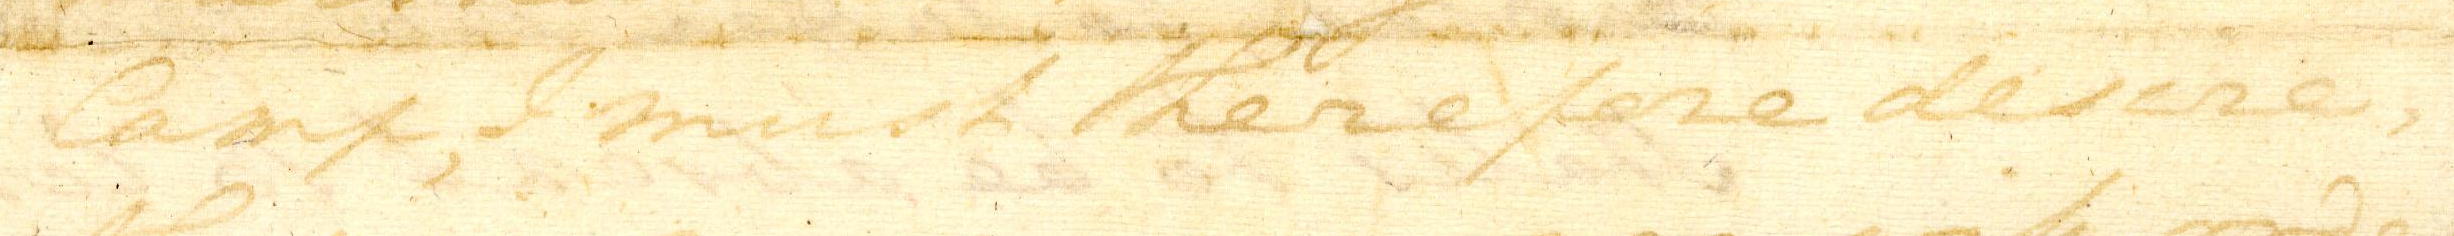Camp, I must therefore desire,
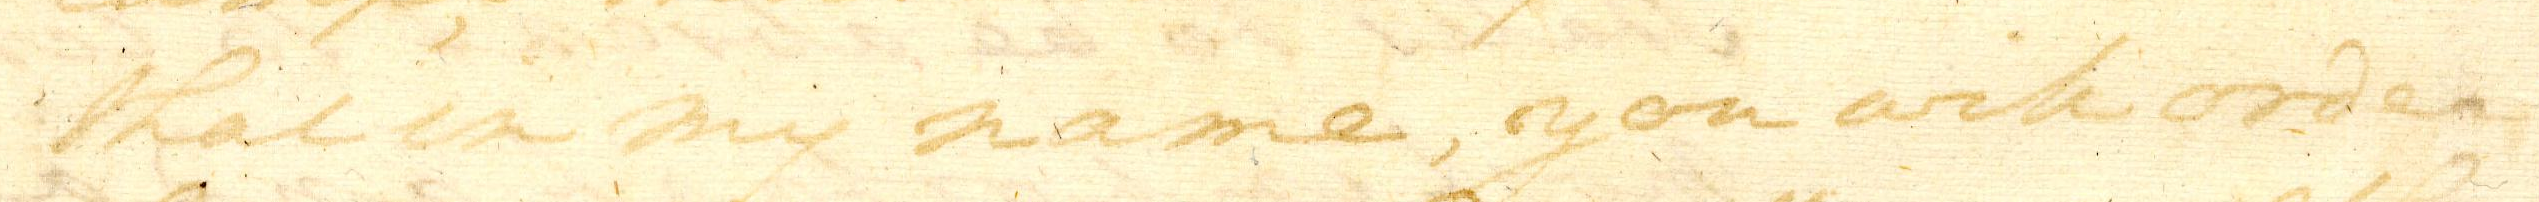that in my name, you will order
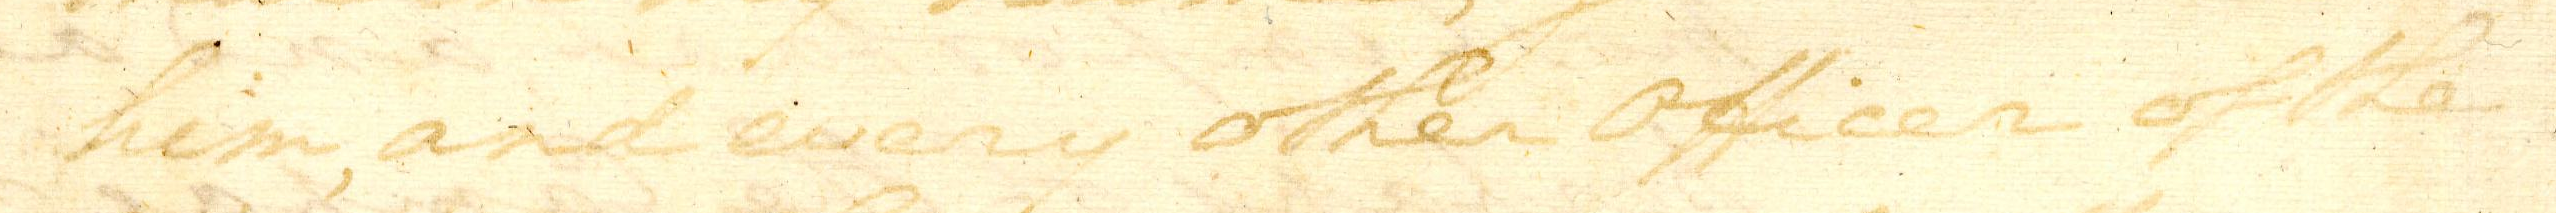him, and every other Officer of the
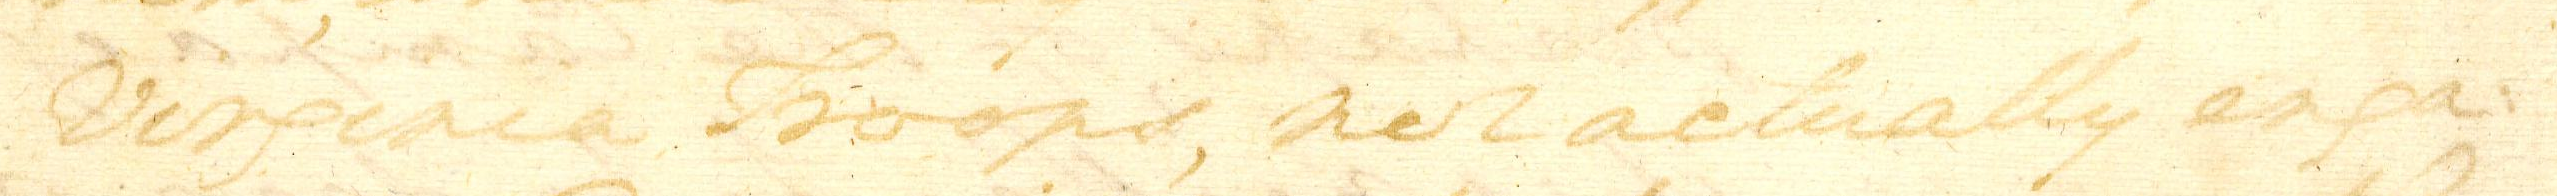Virginia Troops, not actually enga
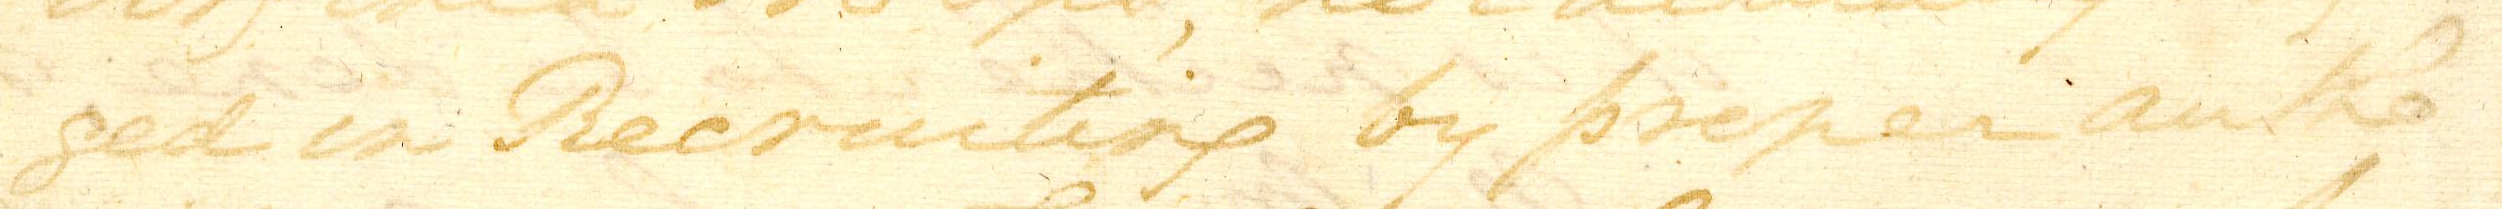ged in Recruiting by proper autho
